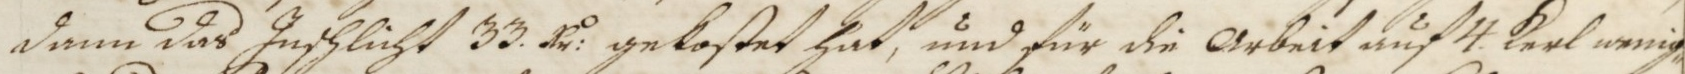dann das Inschlicht 33. Xr. gekostet hat, und für die Arbeit auf 4. Kerl wenig-
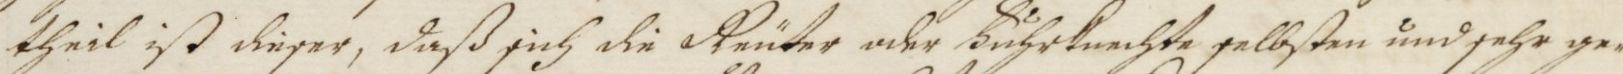theil ist dieser, daß sich die Reüter oder Fuhrknechte selbsten und sehr ge-
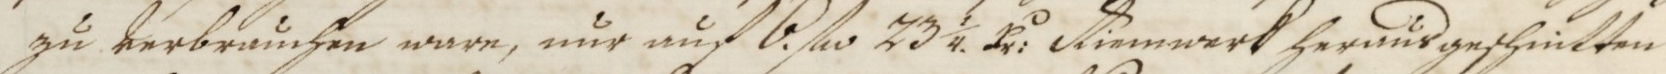zu verbrauchen ware, nur auf 6. flo. 23 1/4. Xr. Riemwerk herausgeschnitten
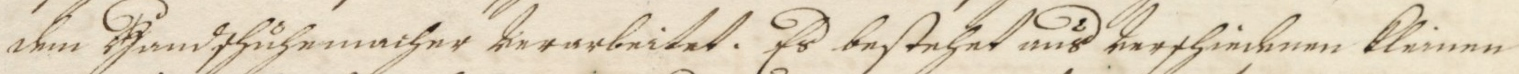dem Handschuhmacher verarbeitet. Es bestehet aus verschiedenen kleinen
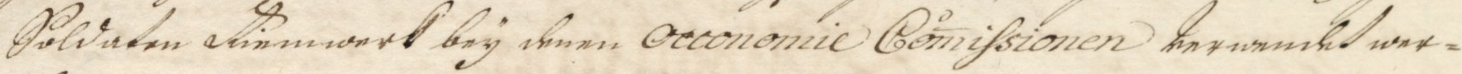Soldaten Riemwerk bey denen Oeconomie Commissionen verwendet wer-
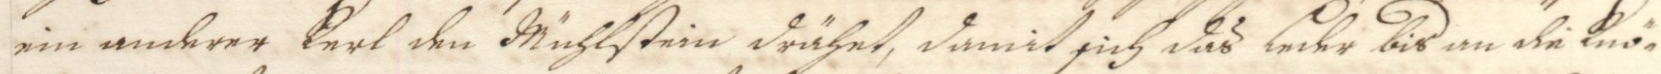ein anderer Kerl den Mühlstein drähet, damit sich das Leder bis an die Knö-
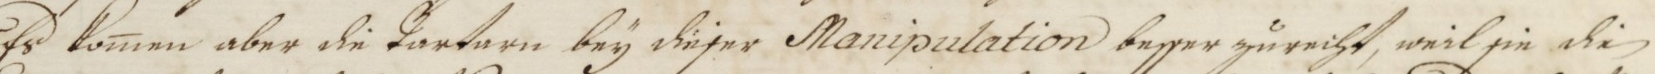Es kommen aber die Tartarn bey dieser Manipulation besser zurecht, weil sie die
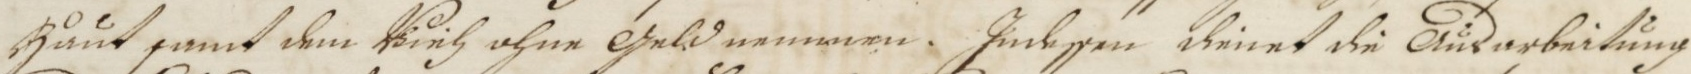Haut samt dem Vieh ohne Geld nemmen. Indessen dienet die Ausarbeitung
